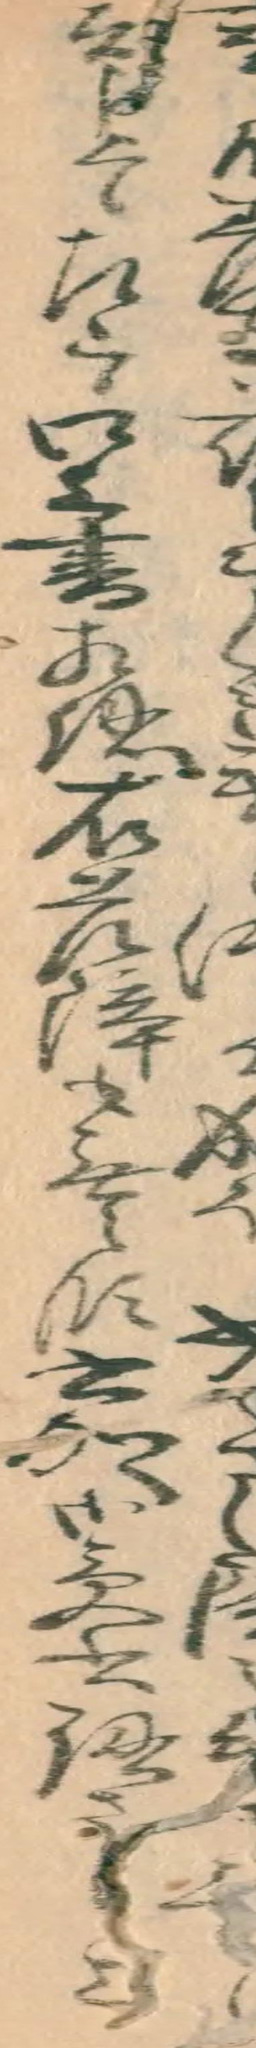旨申上候左候ハヽ口上書相認右差障も無之段書加へ御受書認さし上
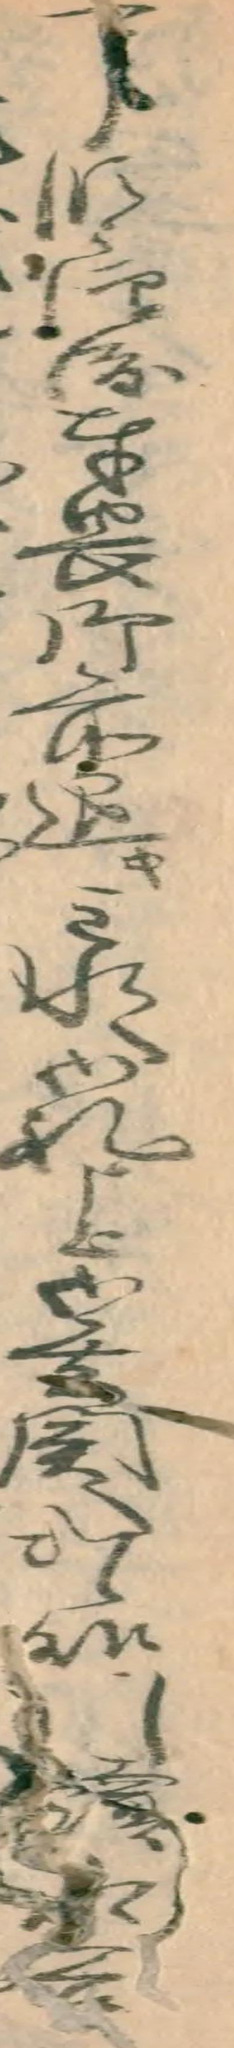可申段被仰渡奉畏御前退キ主水へ御礼申上御玄関へ出候処引続水谷
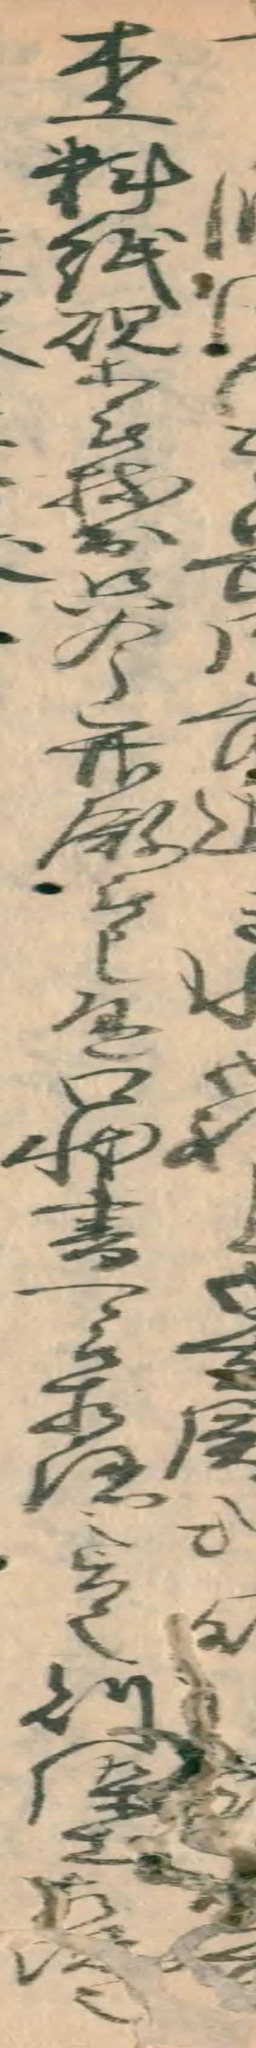木工料紙硯等被持出只今弁殿被申候通口状書可被相認之旨也則保土相認也
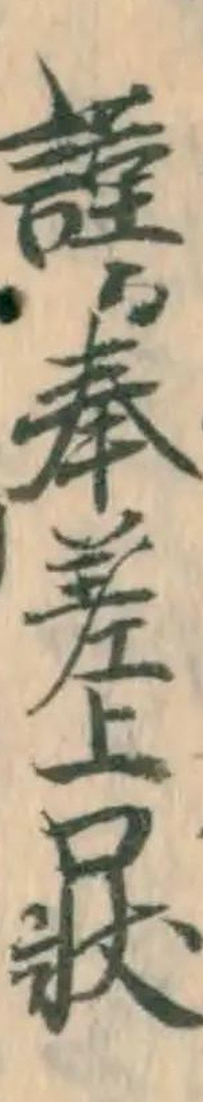謹而差上口状
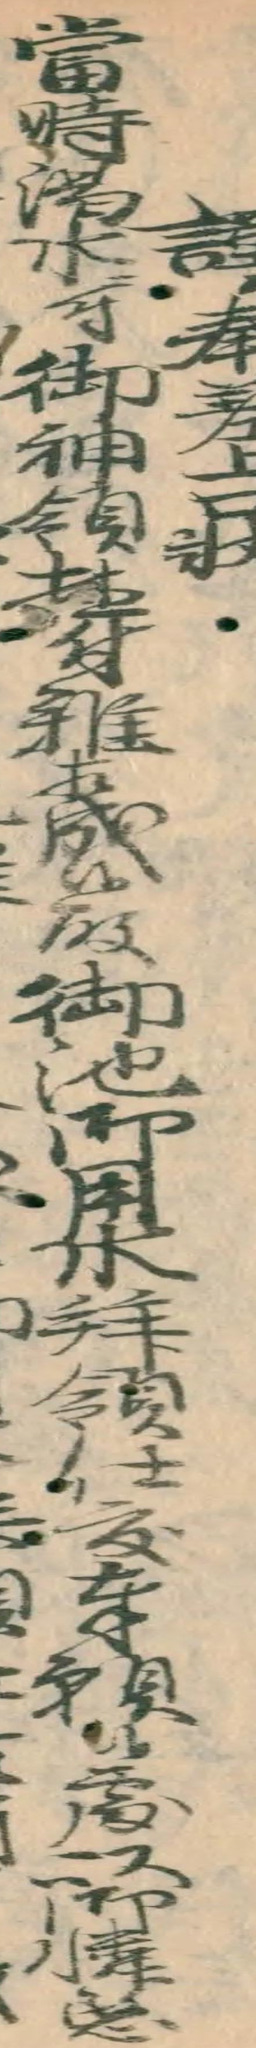当時渇水ニ付御神領植付難相成候故御池御用水拝領仕度奉願候処以御憐愍
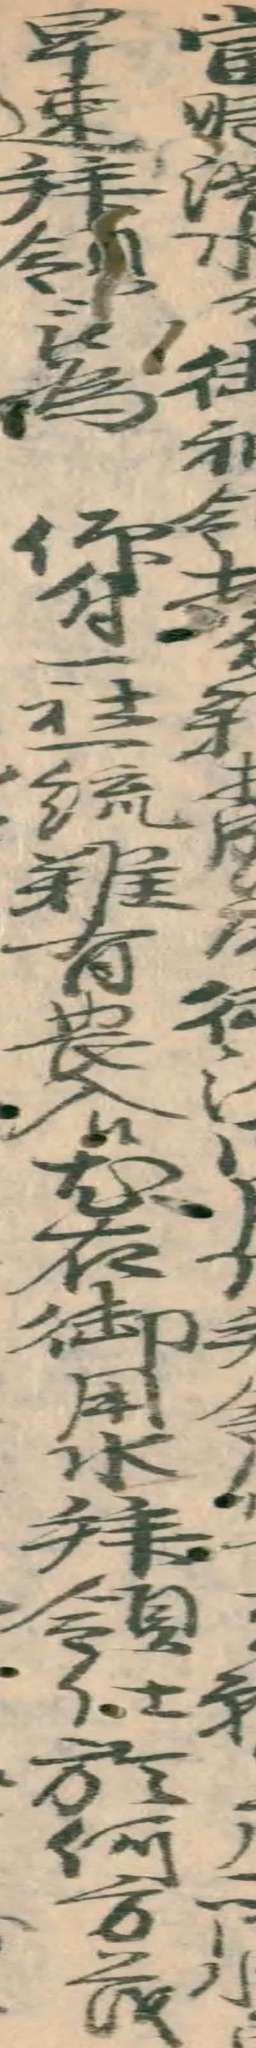早速拝領被為仰付一社一統難有畏入候尤右御用水拝領仕於何方も
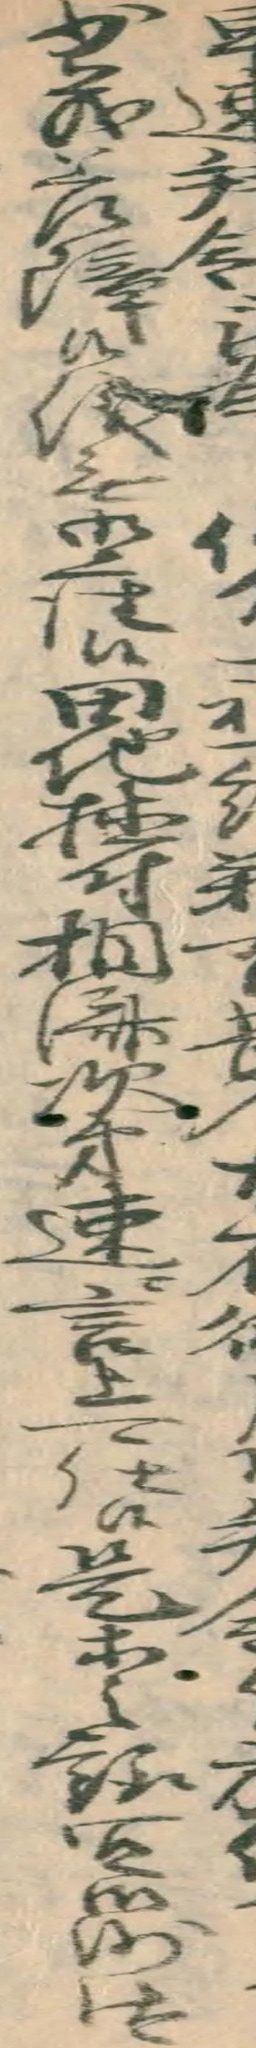少も差障候儀無御座候田地植付相済次第速ニ言上可仕候是等之趣宜御沙汰
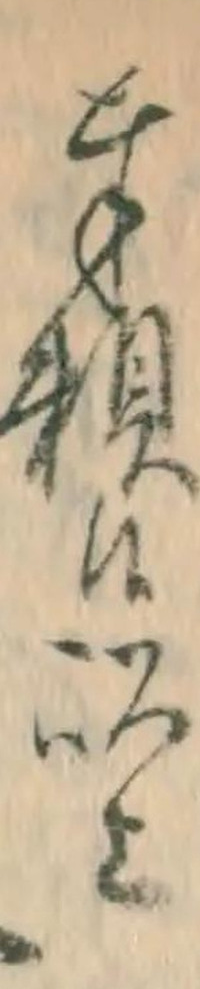奉頼候以上
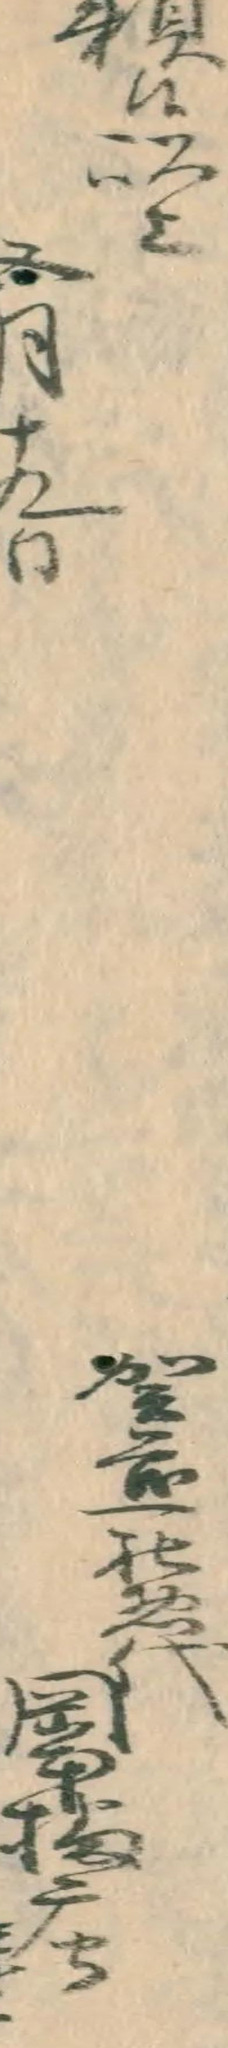五月十九日賀茂一社惣代
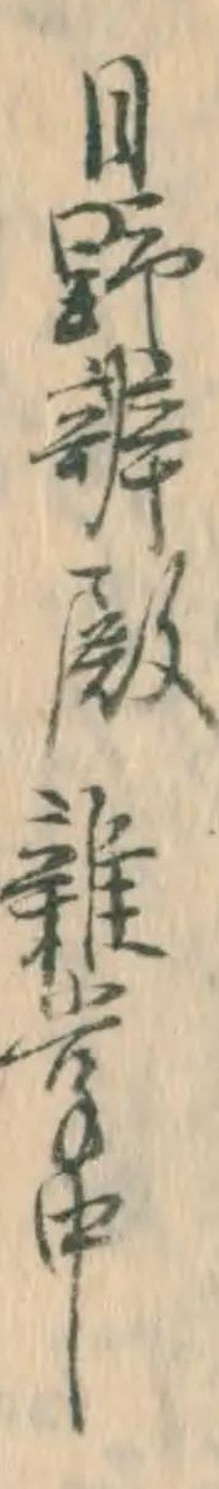日野弁殿雑掌申
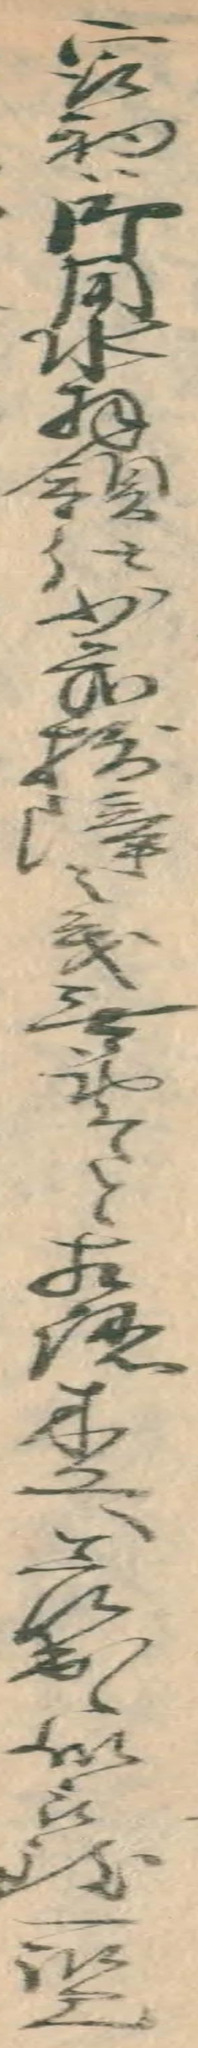最初ハ御用水拝領仕少も指障之義無御座候と相認木工へ差出候処被致一覧
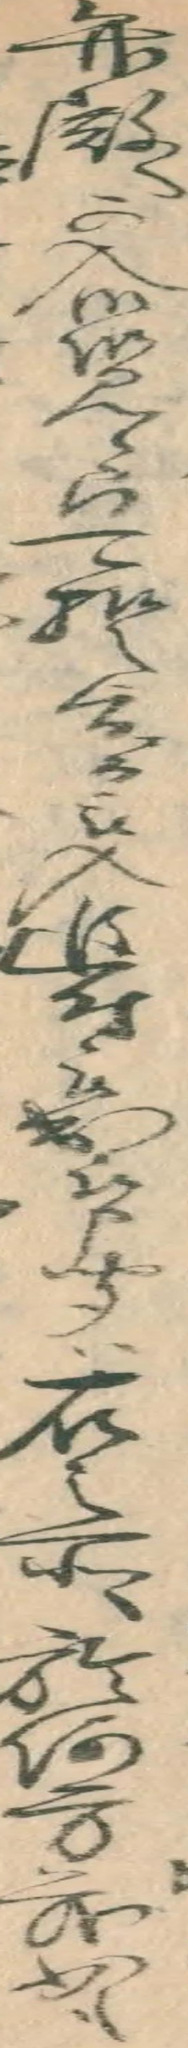弁殿へ可入御覧候間可扣之旨ニ而被入追付被出被申聞候ハ右之所へ於何方も少も
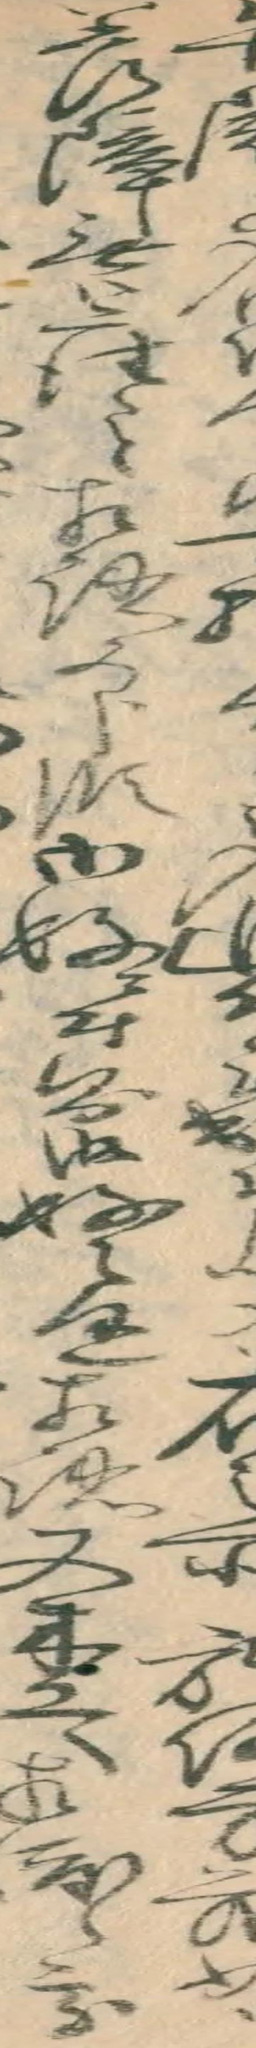差障無御座候と相認可申段御好ニ付則於好之通相認又木工へ相渡候処
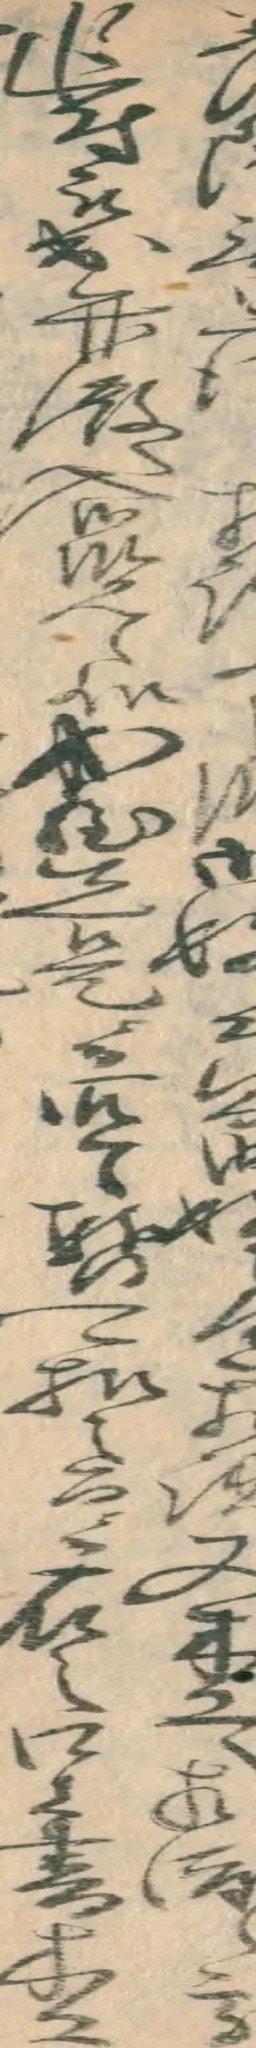追付被出弁殿へ入御覧候処成程先是ニ而宜候暫可扣之旨ニ而右之口上書木工
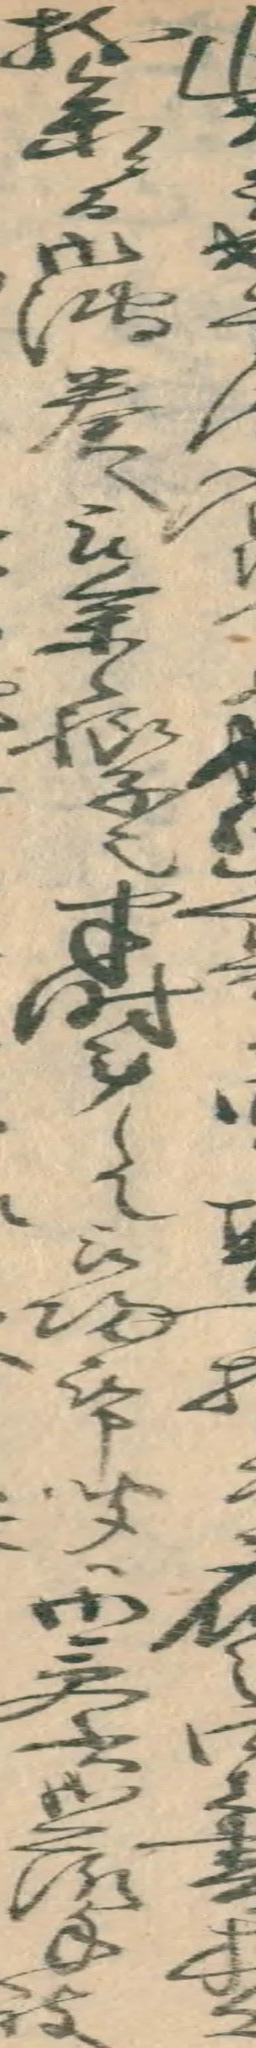持参ニ而御伝奏へ被参候様子也半時計して被帰被申聞ハ御受書御落手被
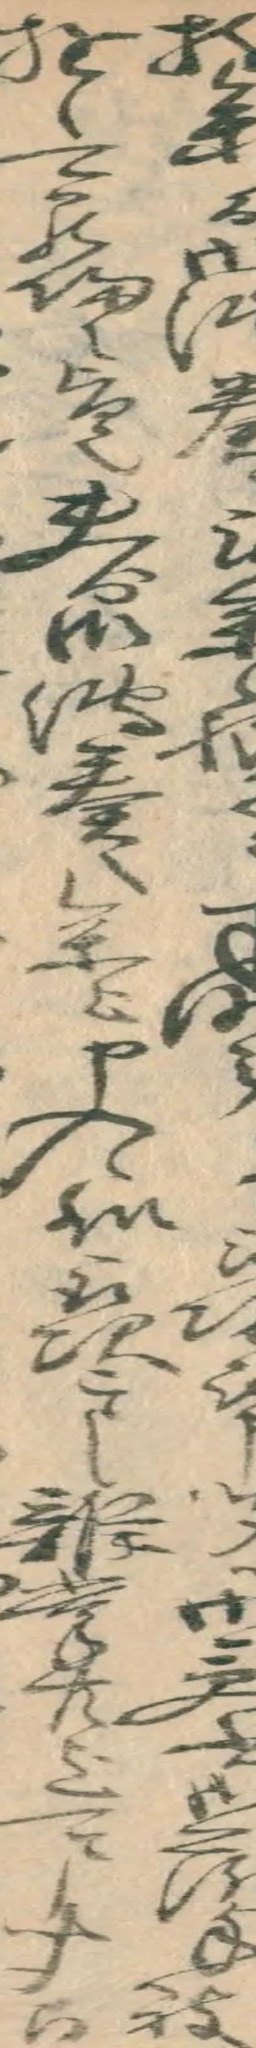遊候可罷帰之旨也夫ゟ御伝奏へ参上申入候処取次被申雑掌共迄可被申聞間
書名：賀茂社記録. 第58冊
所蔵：国立国会図書館 National Diet Library, JAPAN
